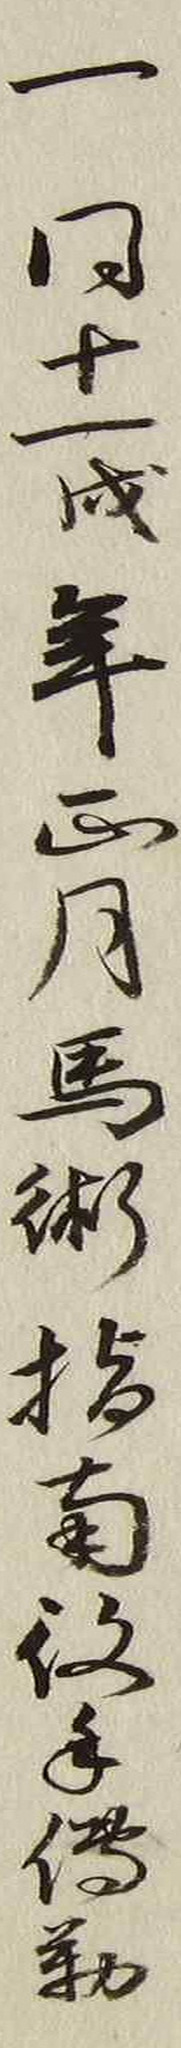一同十一戌年正月馬術指南役手伝勤
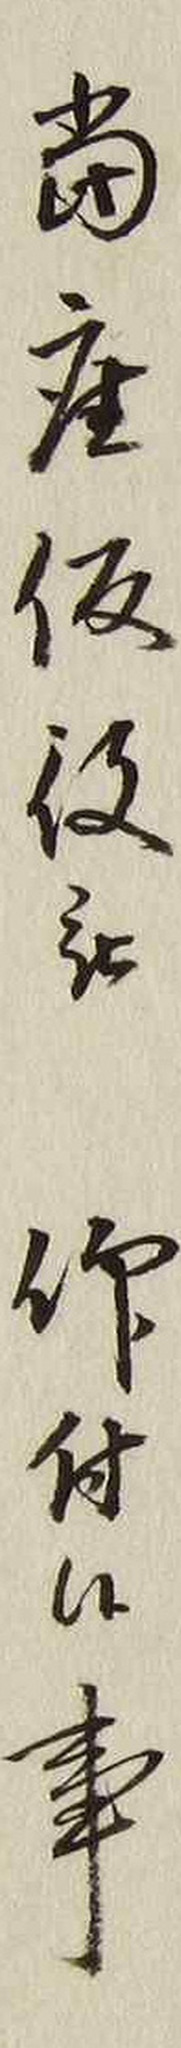当座仮役被仰付候事

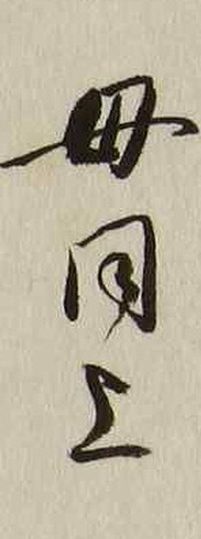母同上
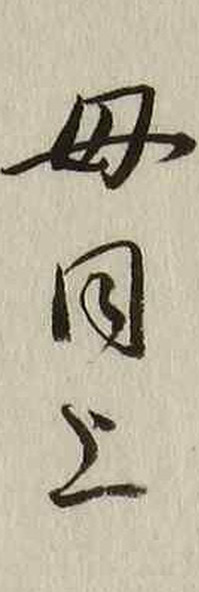母同上
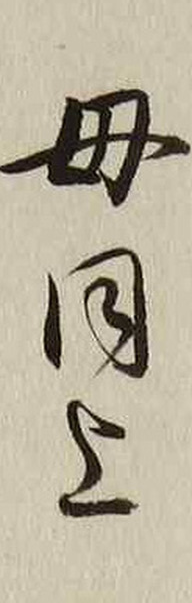母同上
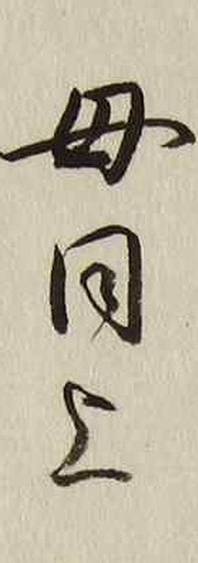母同上
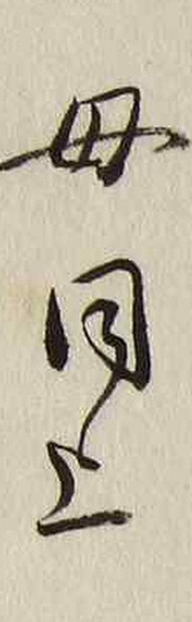母同上

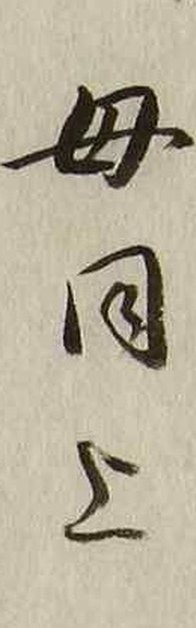母同上
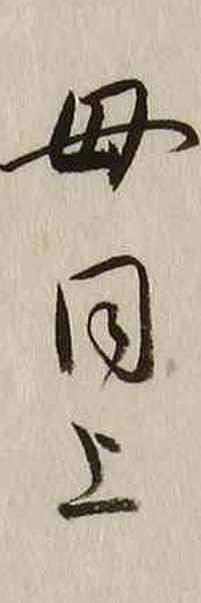母同上
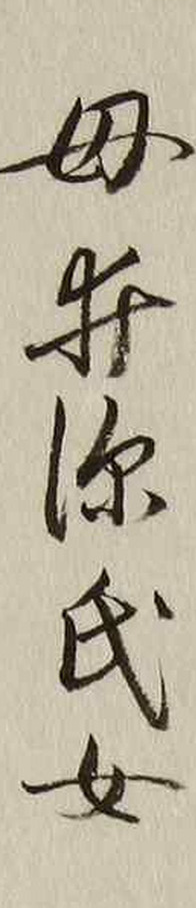母井深氏女
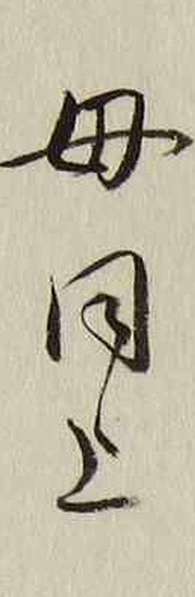母同上

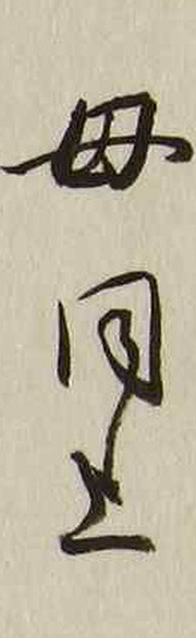母同上
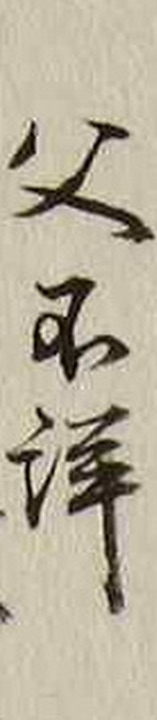父不詳
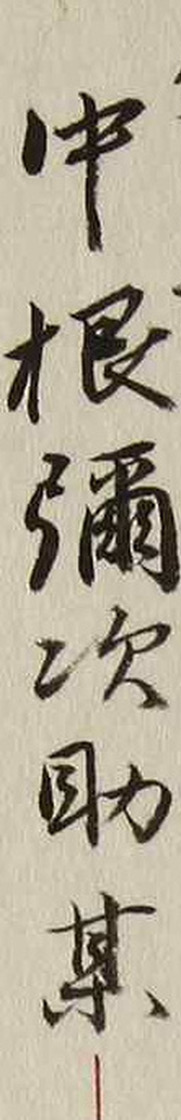中根彌次助某
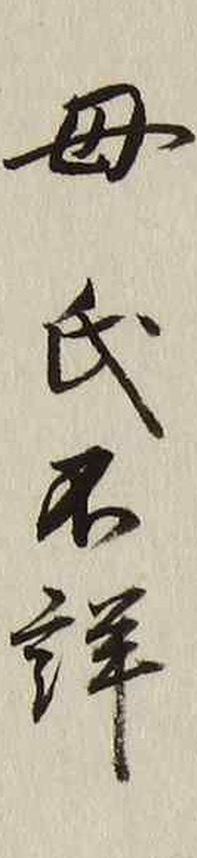母氏不詳
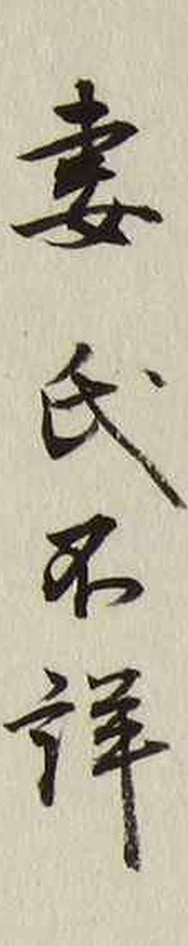妻氏不詳
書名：諸士系譜　巻之160　な之部2
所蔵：会津若松市立会津図書館
